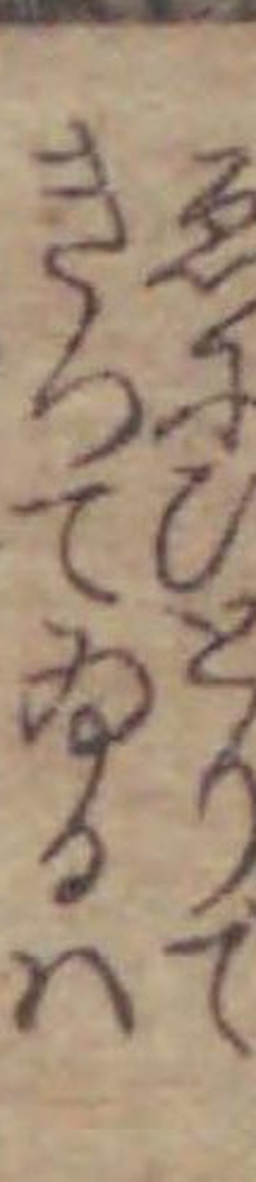きつてゐるは
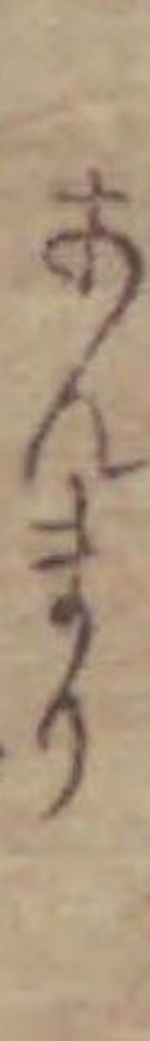あんまり
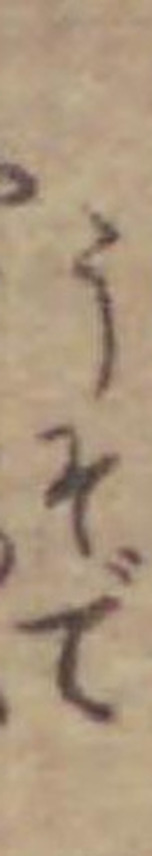うそで
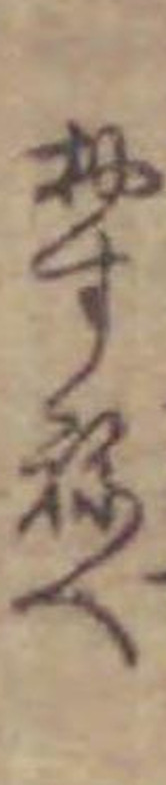おすねへ
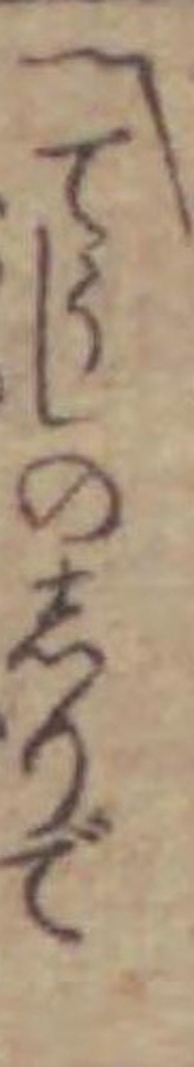「てうしのしりで
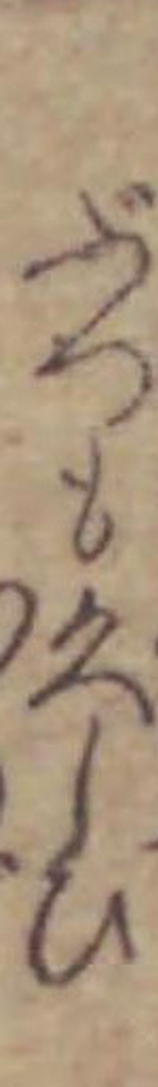ぶつも久しい
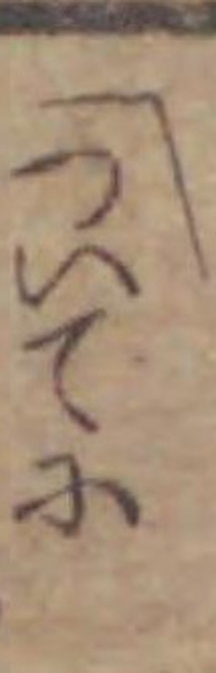「ついてに
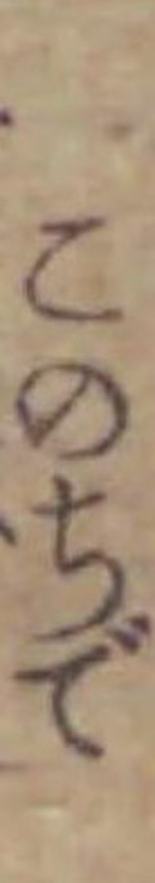このちで
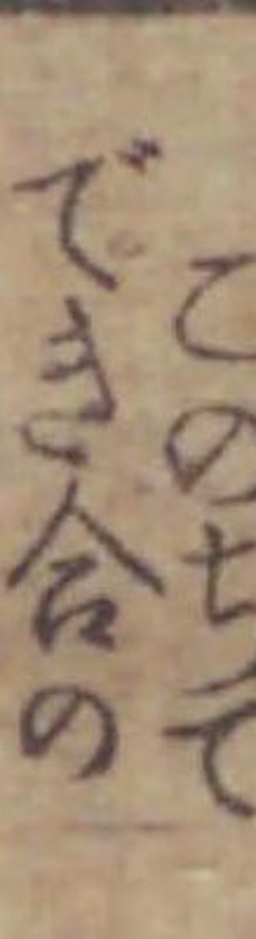でき合の
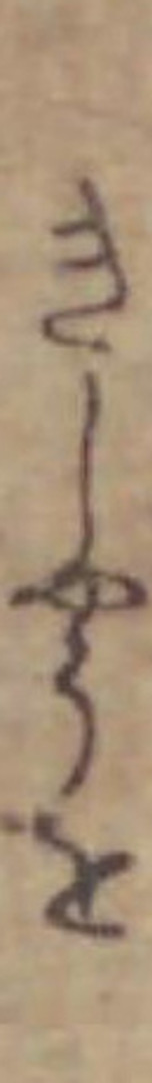きしやうを
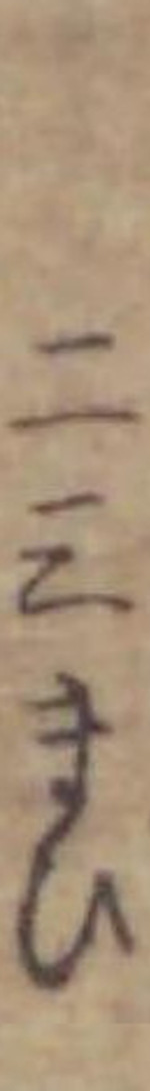二三まひ
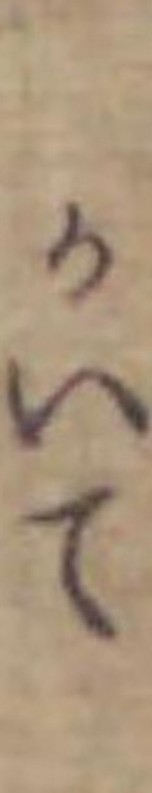かいて
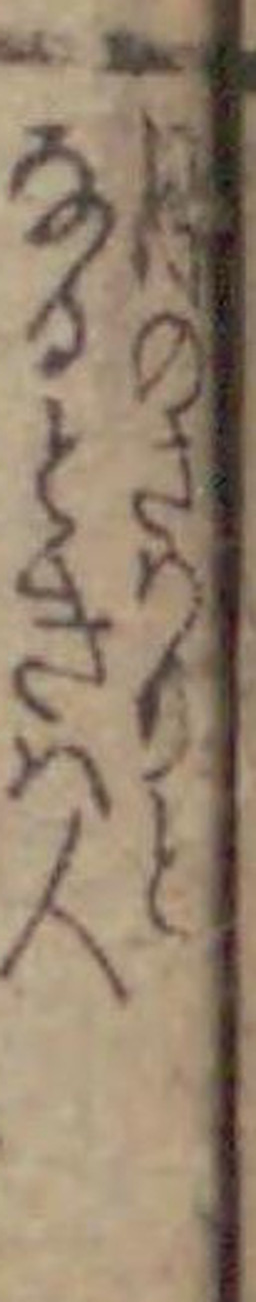なるときは人
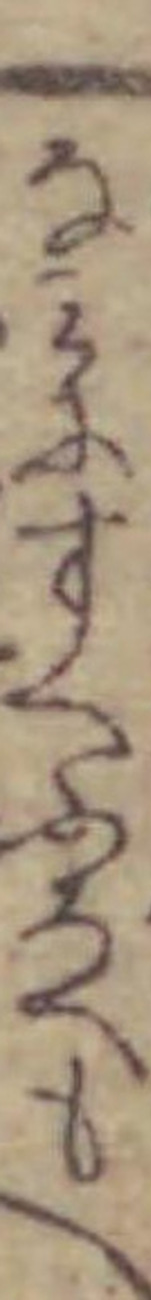なみにすへふろへも
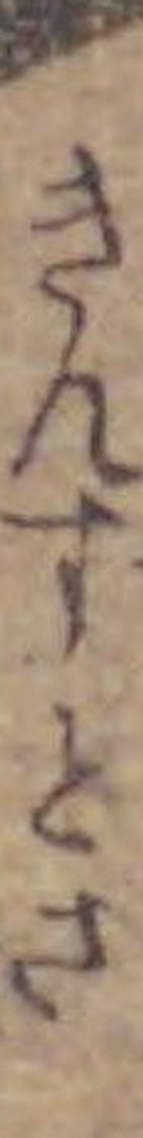きんすとさ
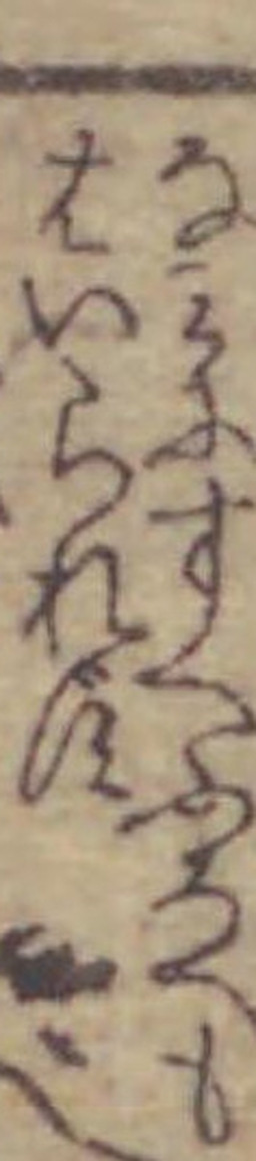はいられず
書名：九替十年色地獄 : 3巻
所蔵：国立国会図書館 National Diet Library, JAPAN
